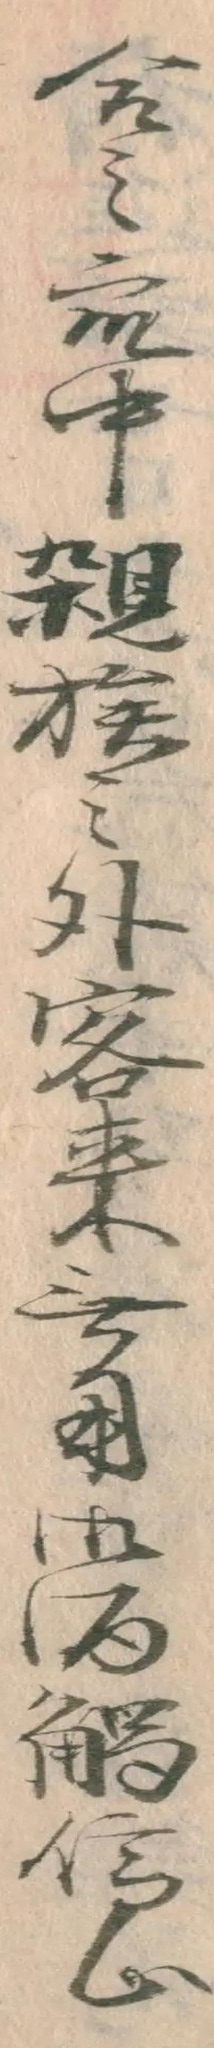合之衆中親族之外客来無用御酒触停止
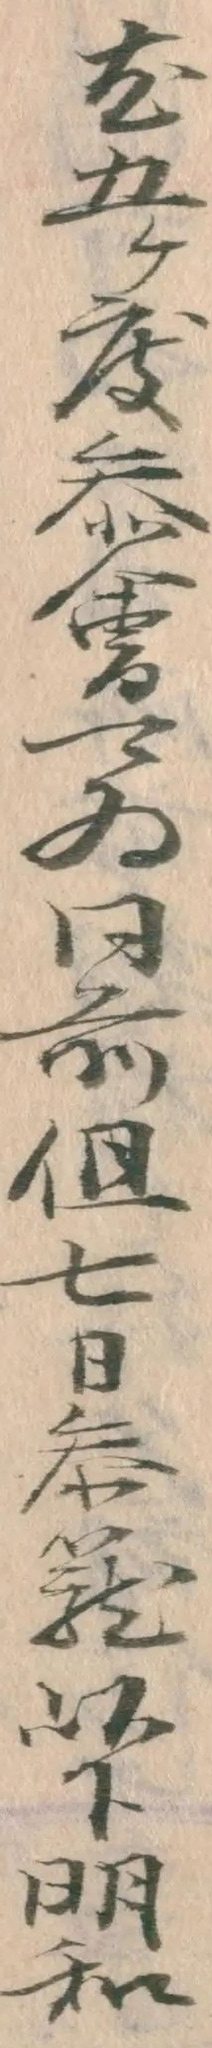尤五ケ度参會可為同前但七日参籠以下明和
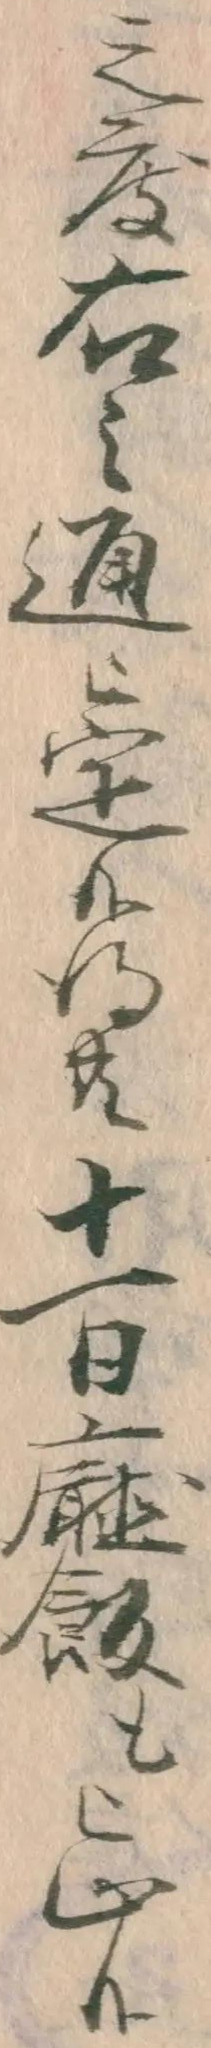之度右之通被定候得共十一日廳飯も被止候
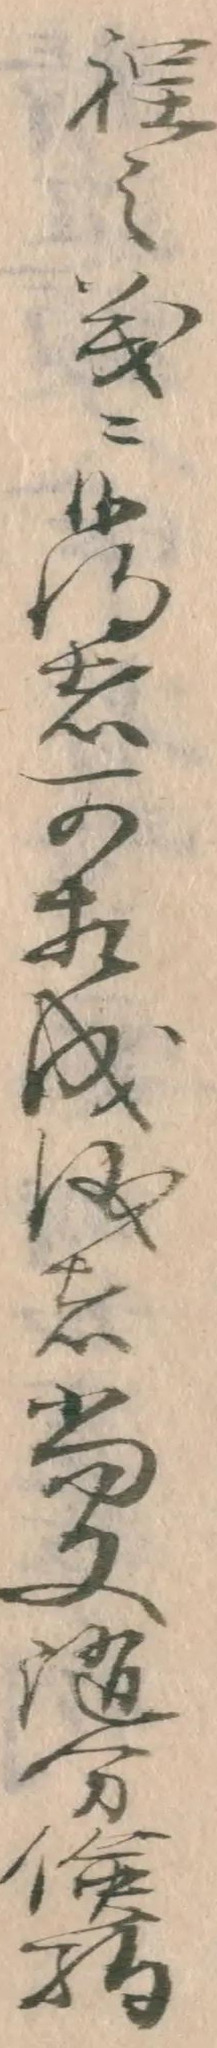程之義ニ候得者可相成儀者尚又随分倹約
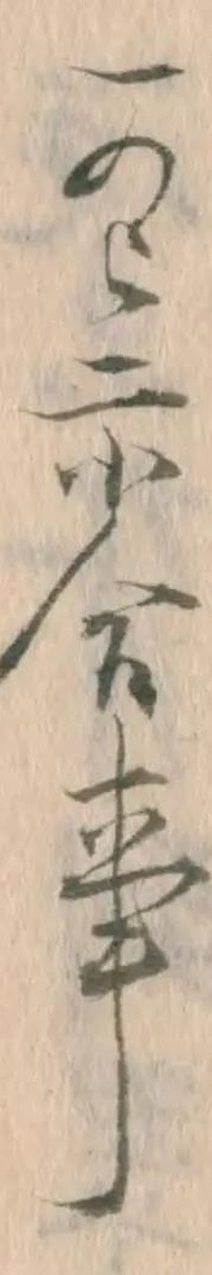可被示合事
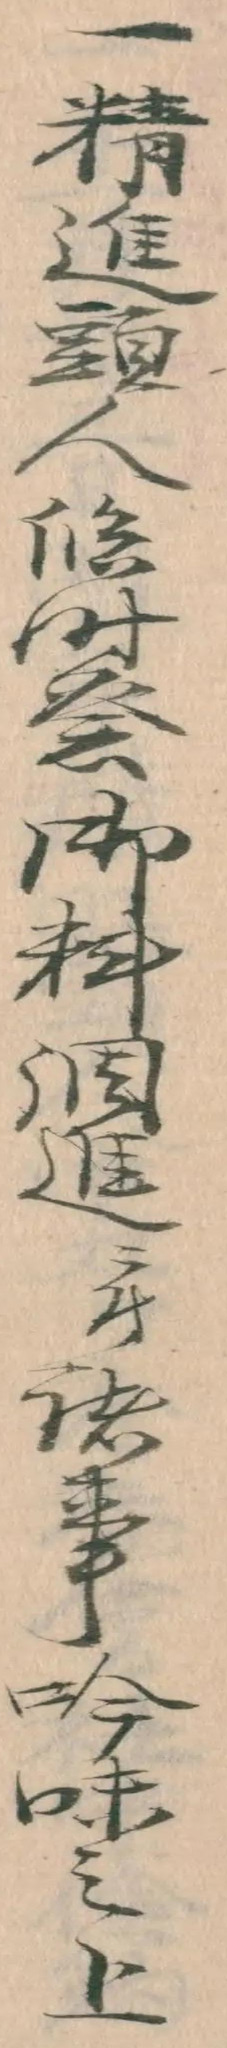一精進頭人臨時祭御料調進ニ付諸事吟味之上
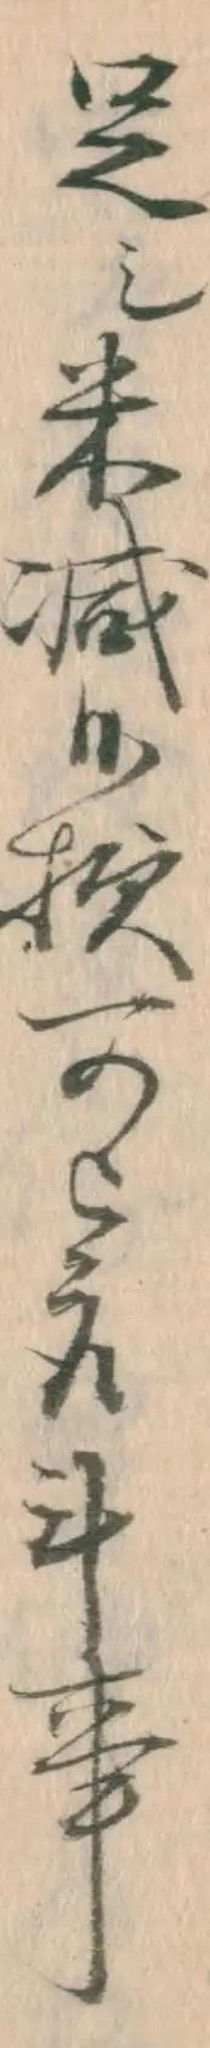足シ米減候様可被取計事
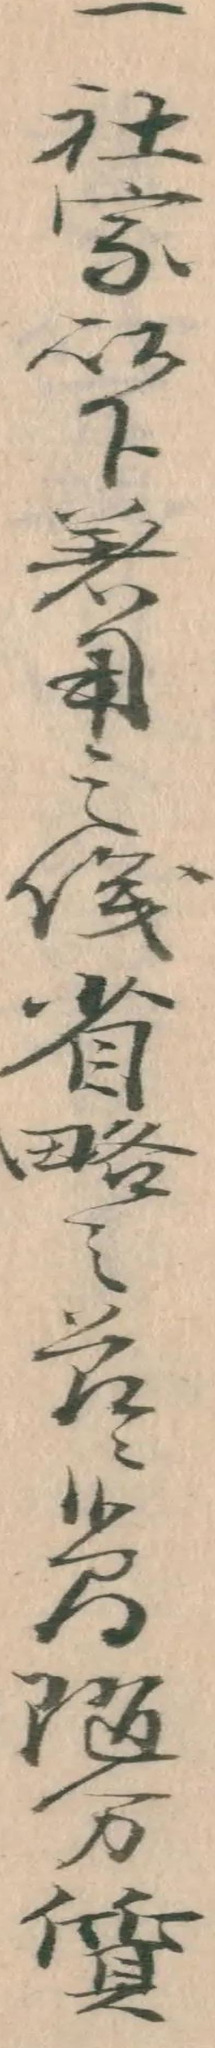一社家以下着用之儀省略之節ニ候間随分質
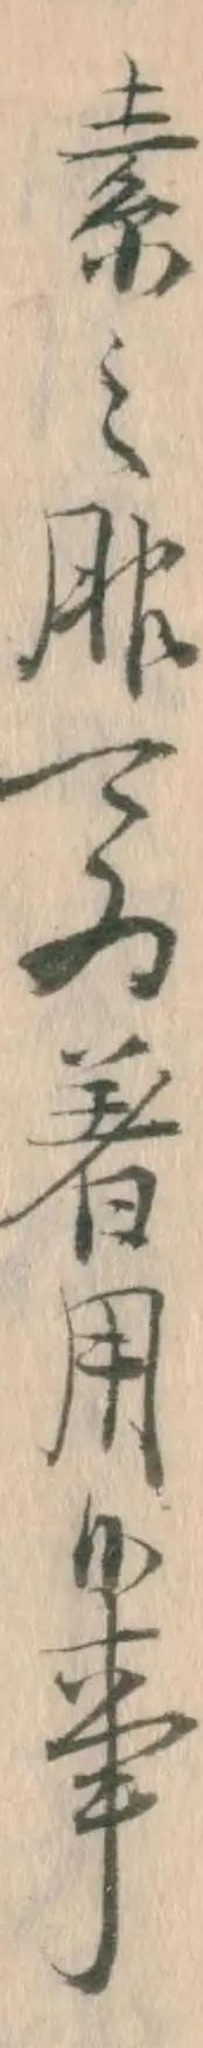素之服可為着用候事
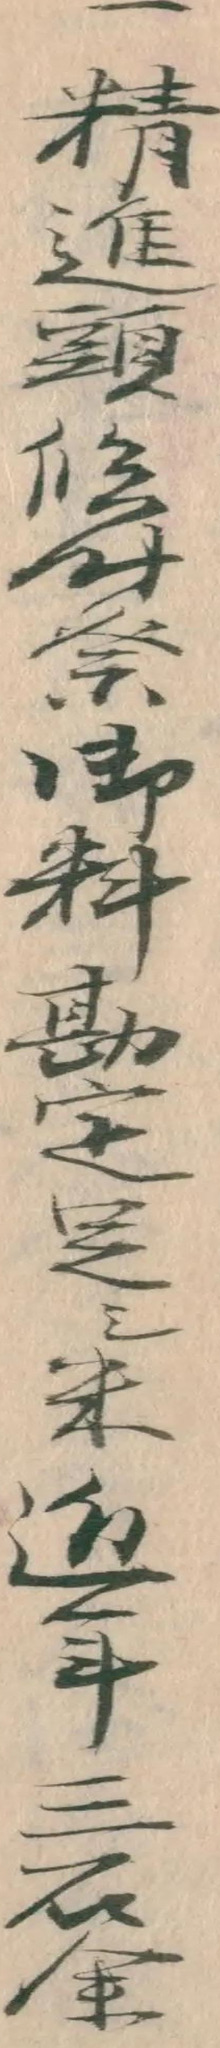一精進頭臨時祭御料勘定足シ米近年三石余
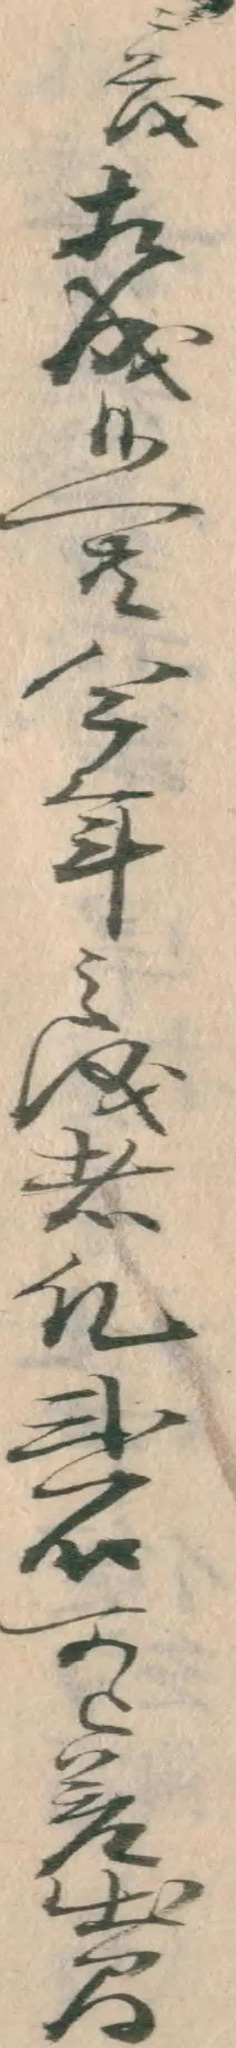ニも相成候へ共今年之儀者凡弐石可被差出間
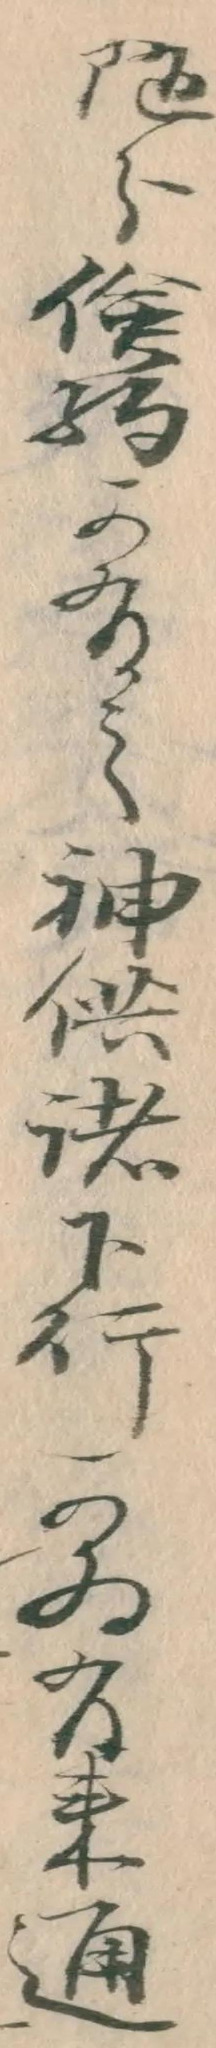随分倹約可有之神供諸下行可為有来通
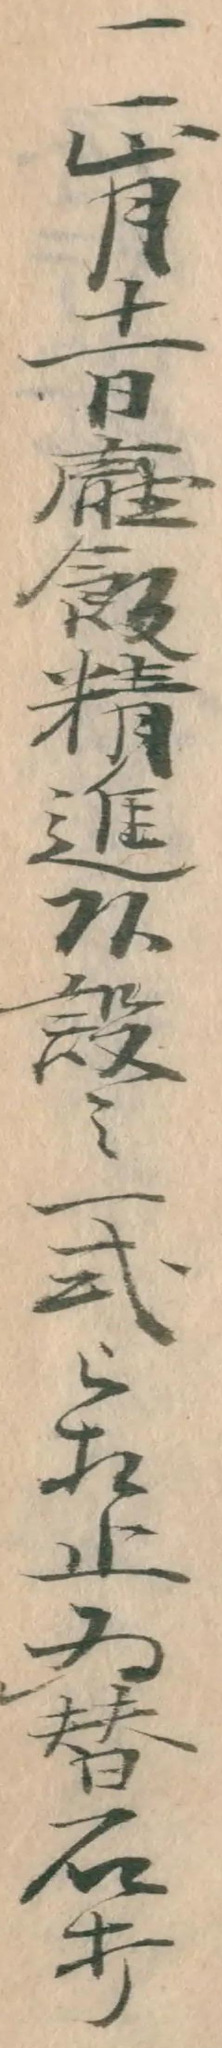一正月十一日廳飯精進頭設之一式被相止為替石打

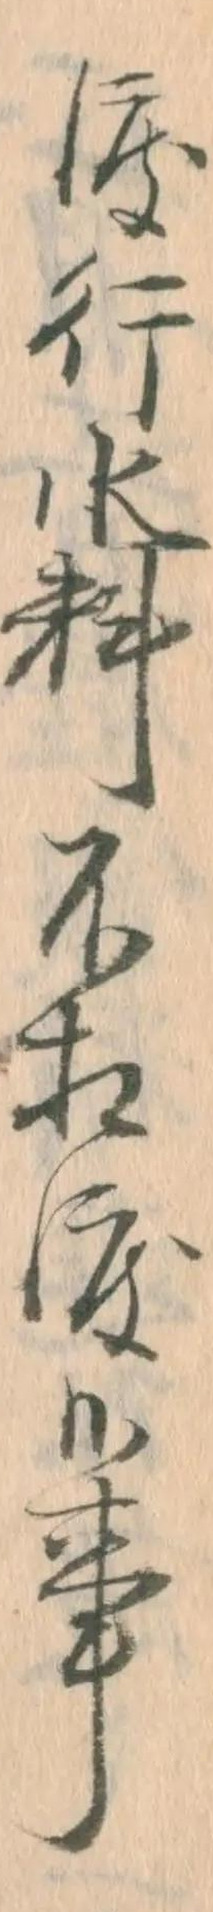渡行水料不相渡候事
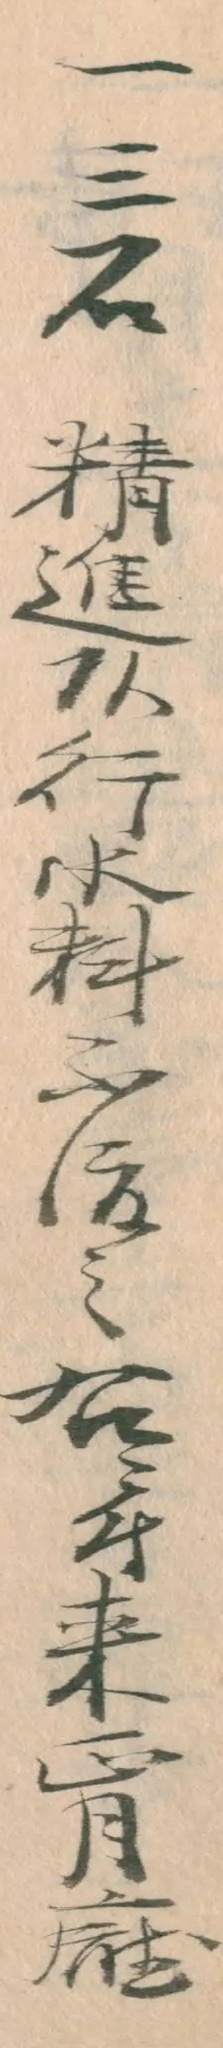一三石精進頭行水料不渡之右ニ付来正月廳
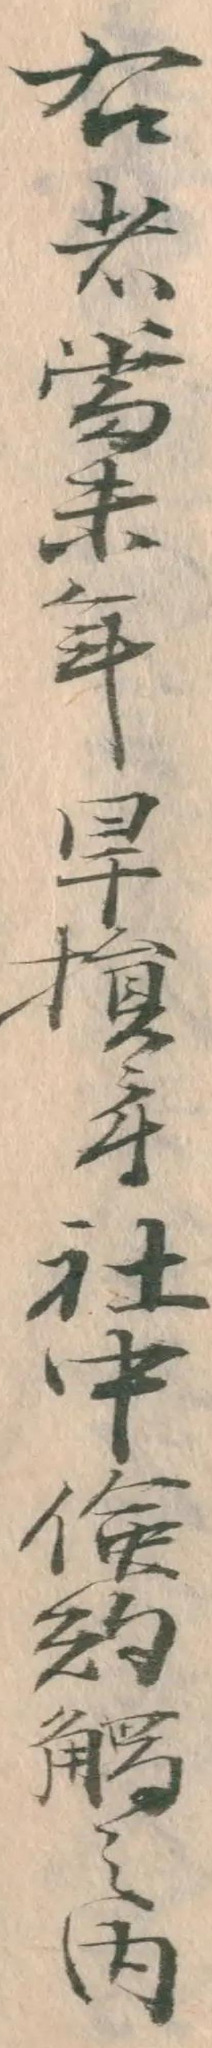右は當未年旱損ニ付社中倹約触之内
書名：賀茂社記録. 第72冊
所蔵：国立国会図書館 National Diet Library, JAPAN
